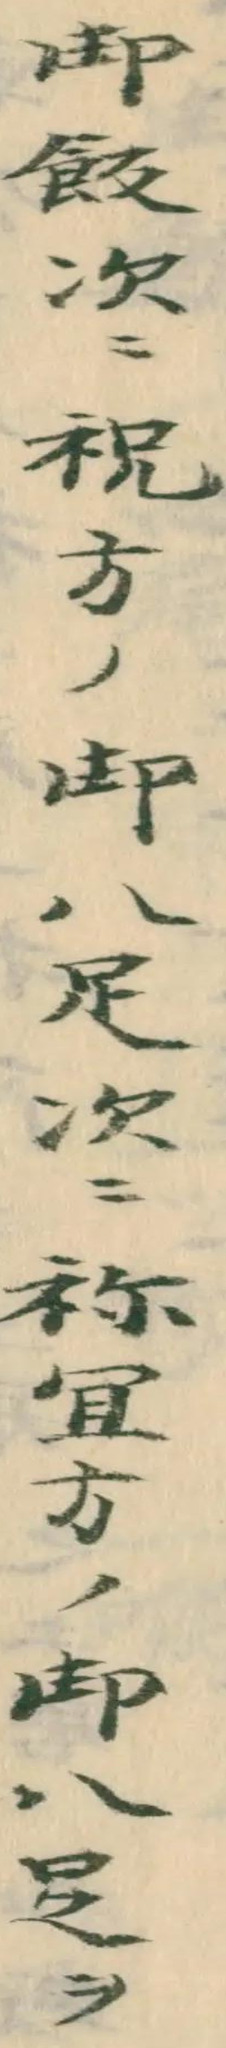御飯次ニ祝方ノ御八足次ニ禰宜方ノ御八足ヲ
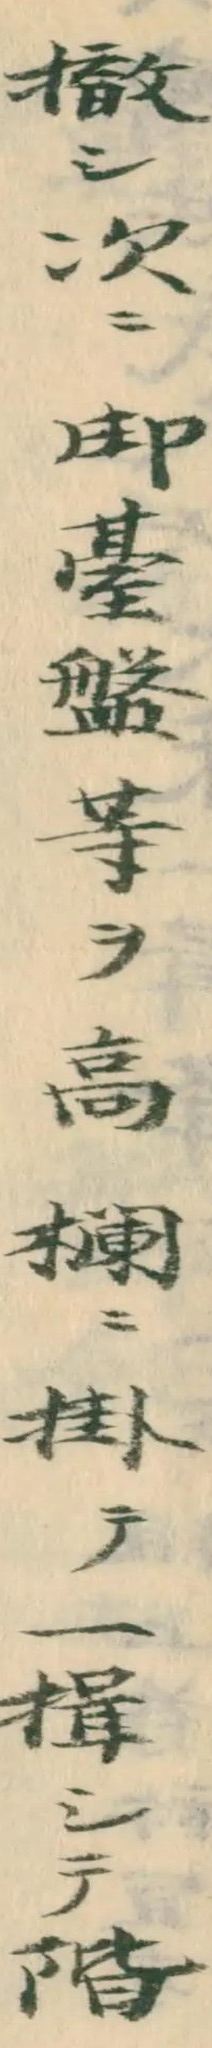撤シ次ニ御台盤等ヲ高欄ニ掛テ一揖シテ階

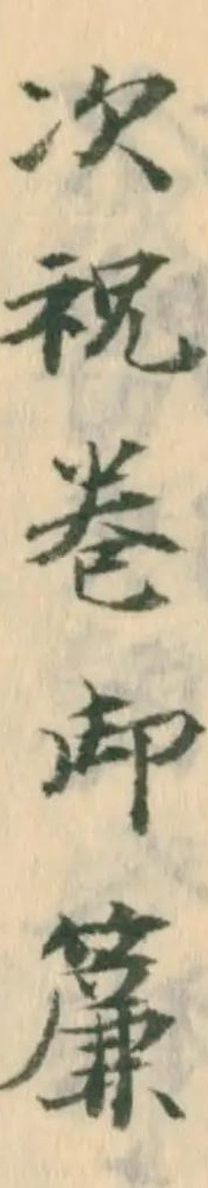次祝巻御簾
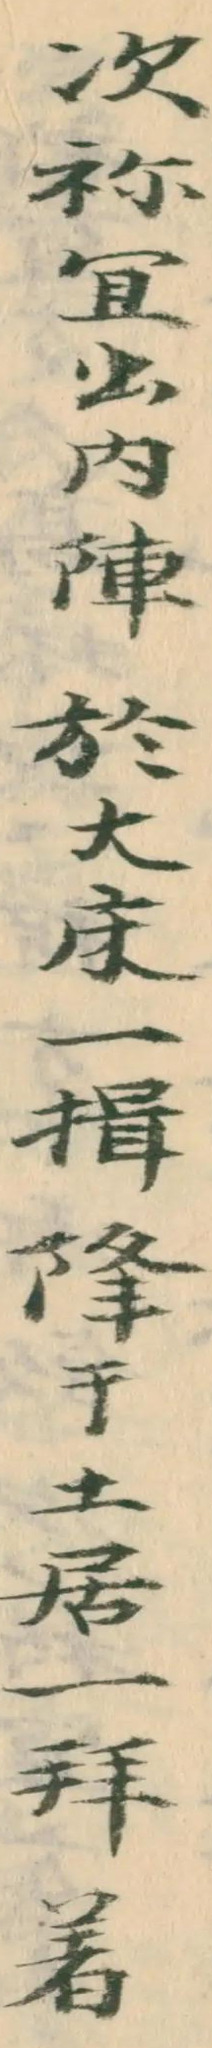次禰宜出内陣於大床一揖降于土居一拝着
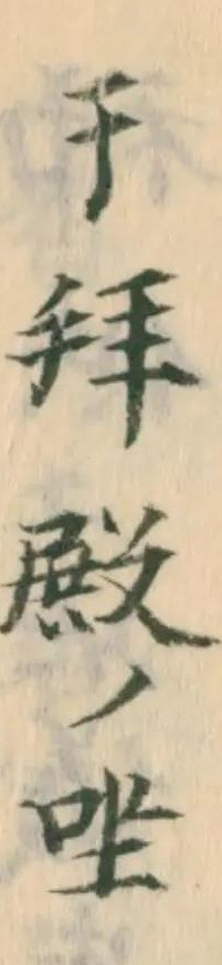于拝殿ノ坐
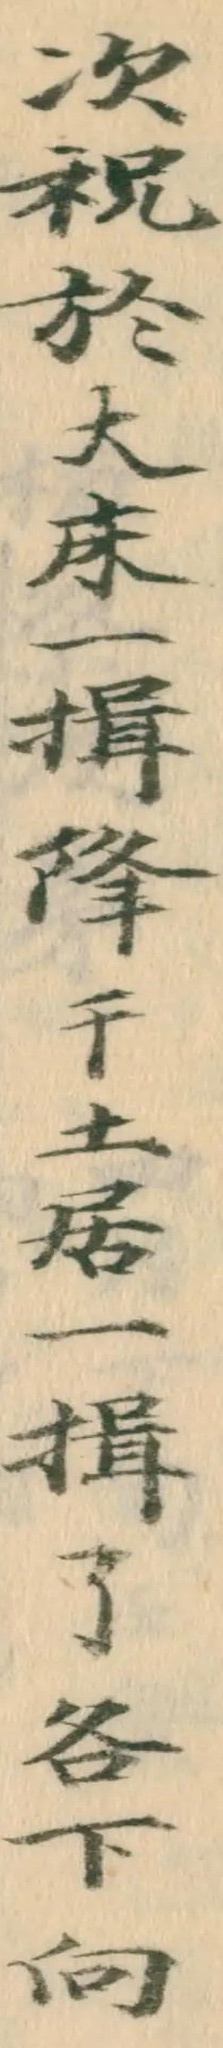次祝於大床一揖降于土居一揖了各下向
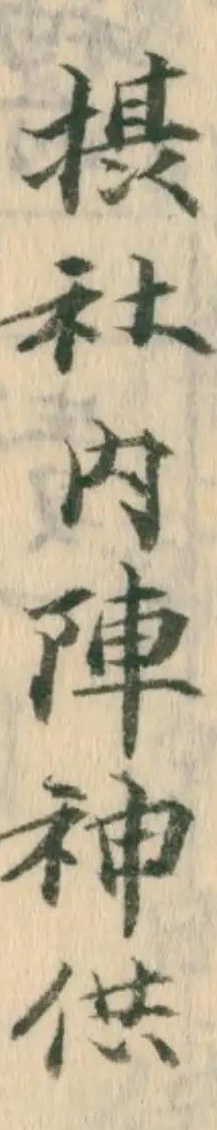摂社内陣神供
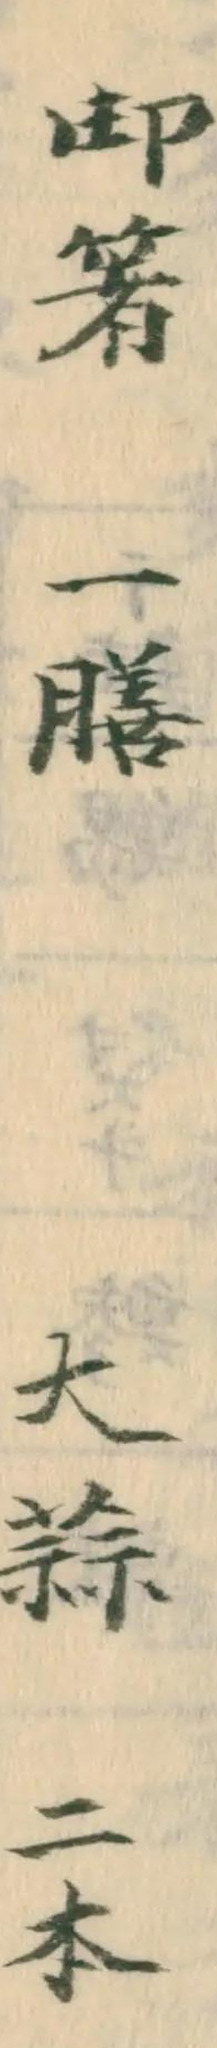御箸一膳大蒜二本
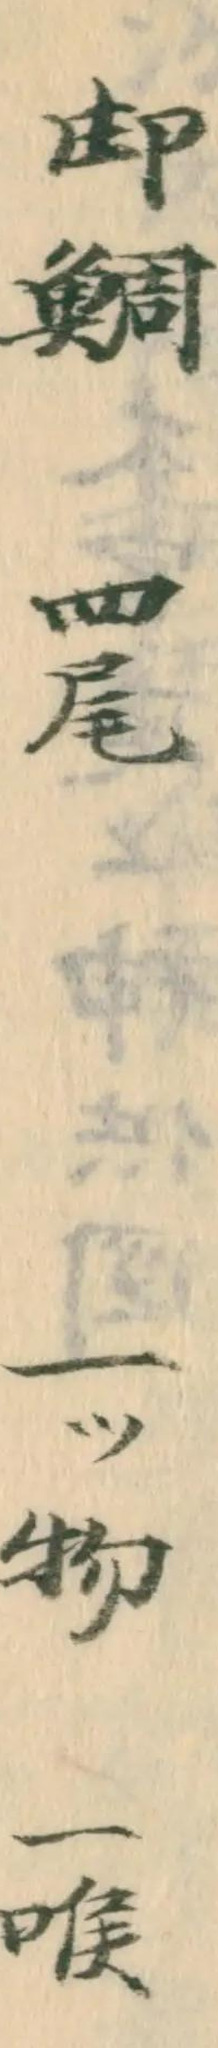御鯛四尾一ツ物一喉
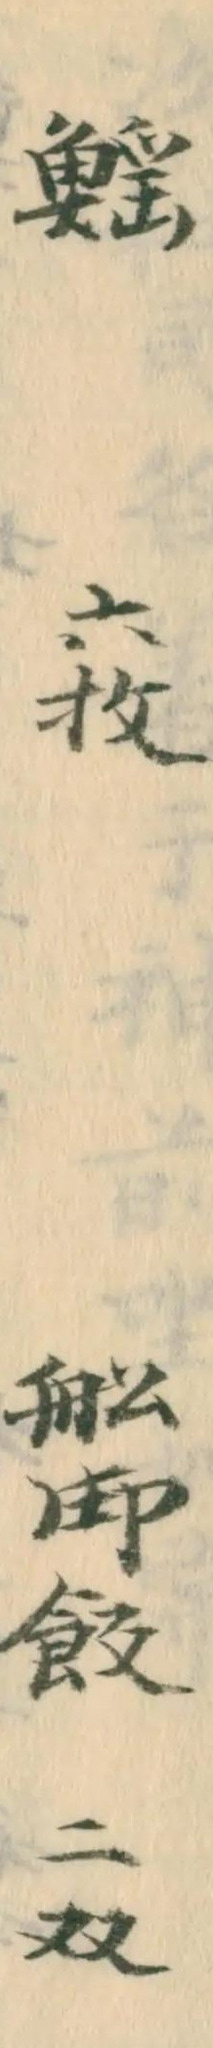鰩六枚船御飯二双
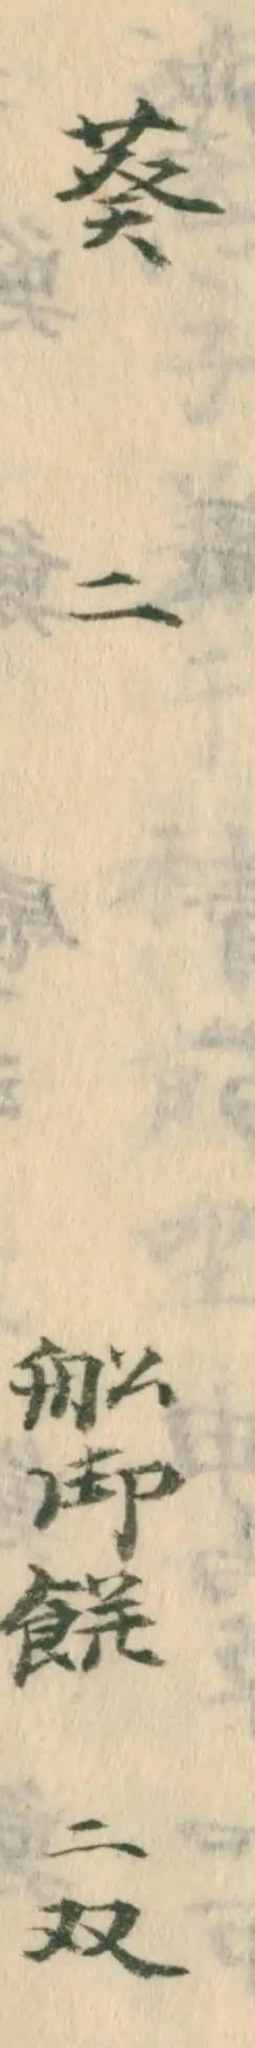葵二船御餅二双
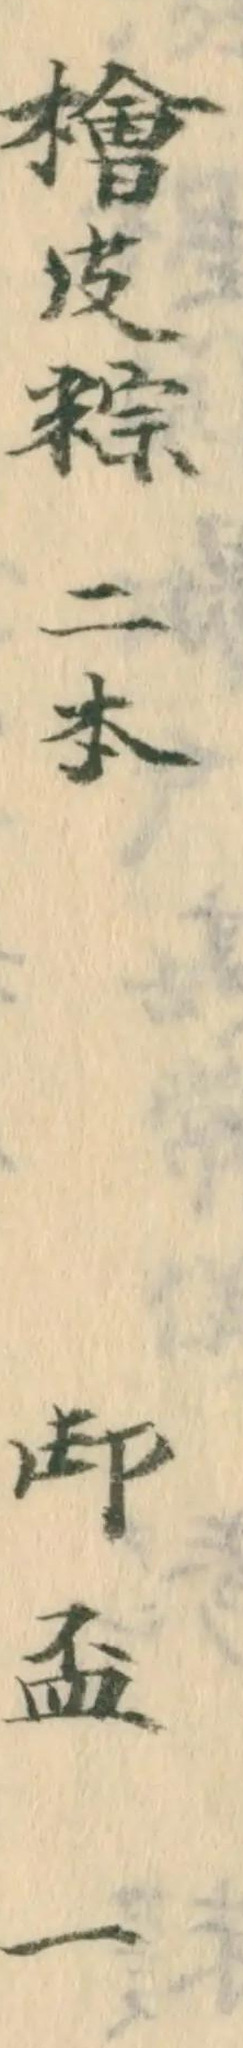檜皮粽二本御盃一
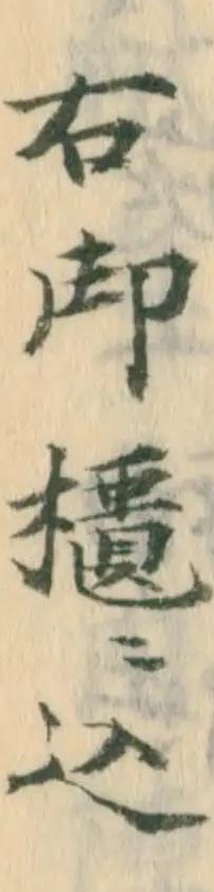右御櫃ニ込

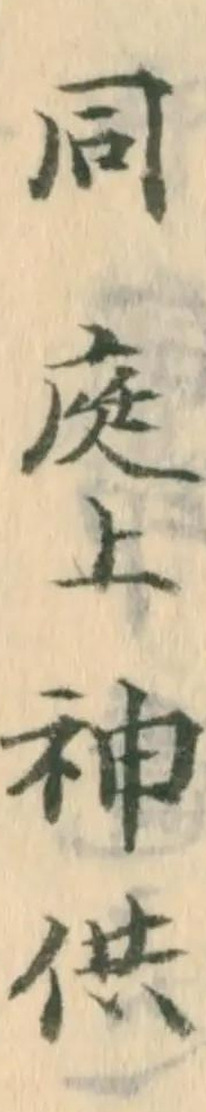同庭上神供
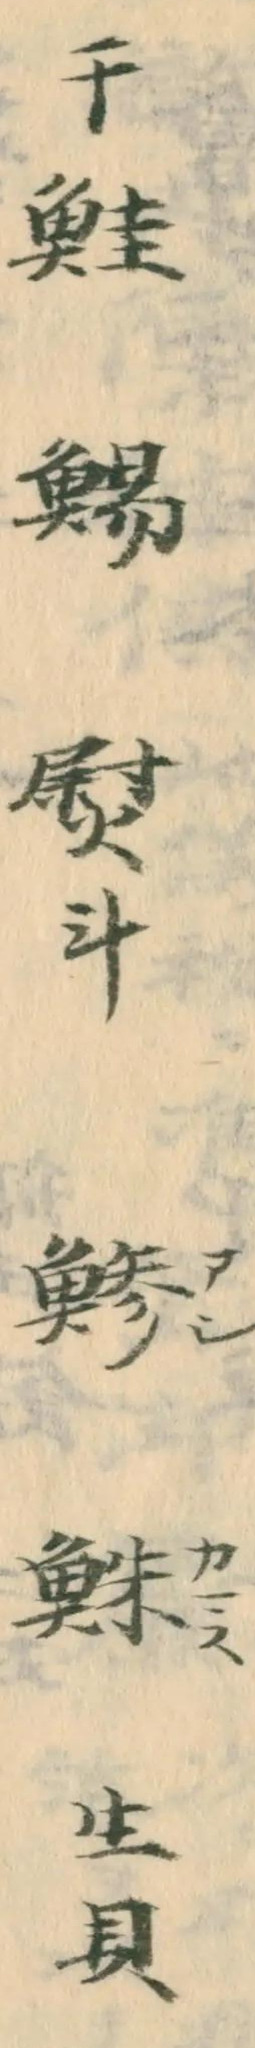干鮭鯣熨斗鯵鮢生貝
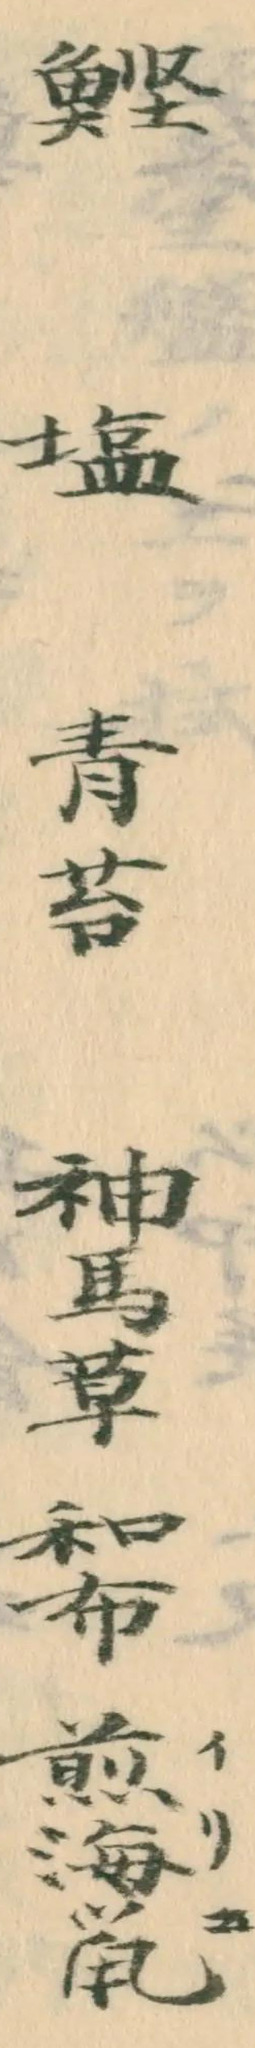鰹塩青苔神馬草和布煎海鼠
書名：賀茂社記録. 第5冊
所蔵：国立国会図書館 National Diet Library, JAPAN
